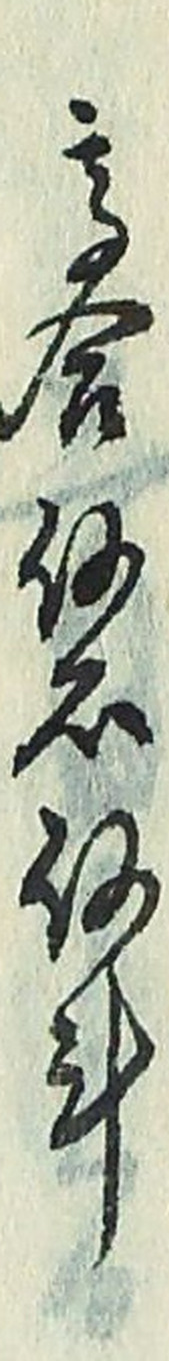高合何石何斗
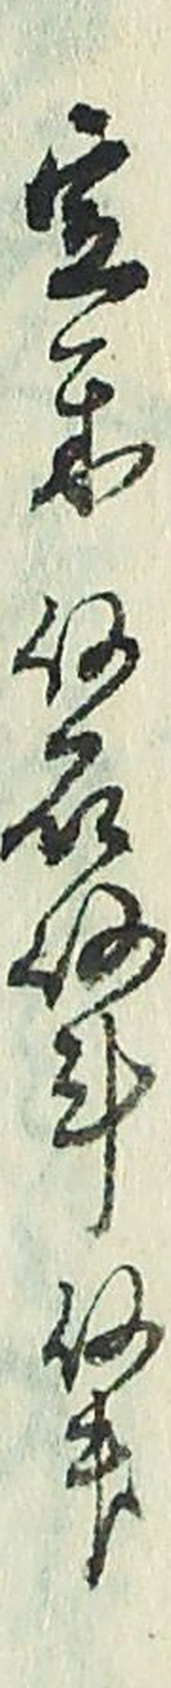定米何石何斗何升
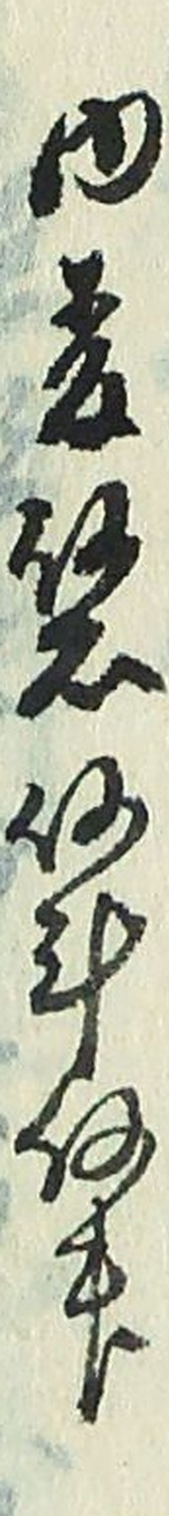内麦何石何斗何升
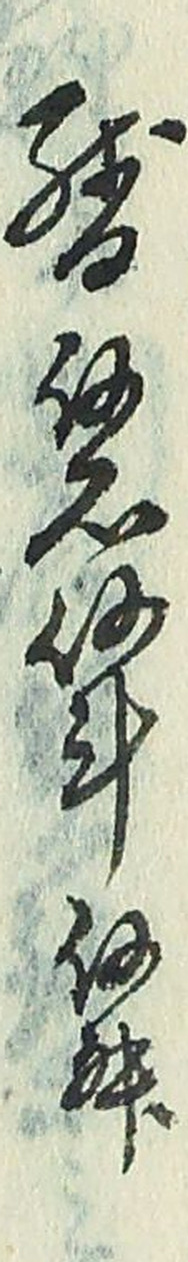定米何石何斗何升
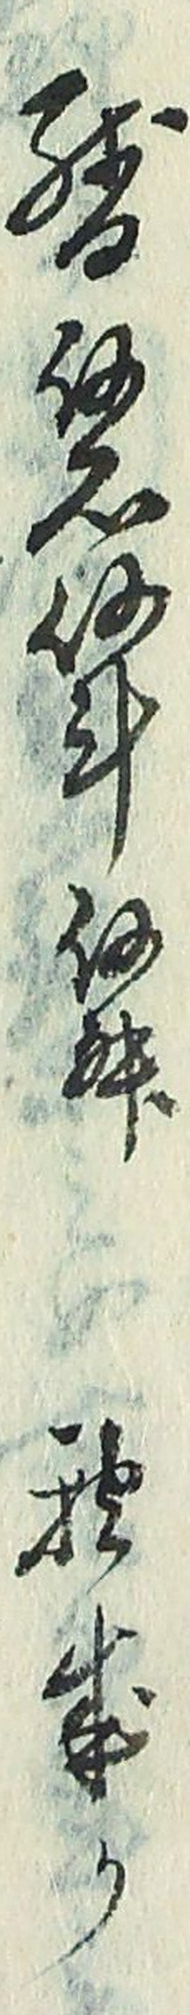定米何石何斗何升
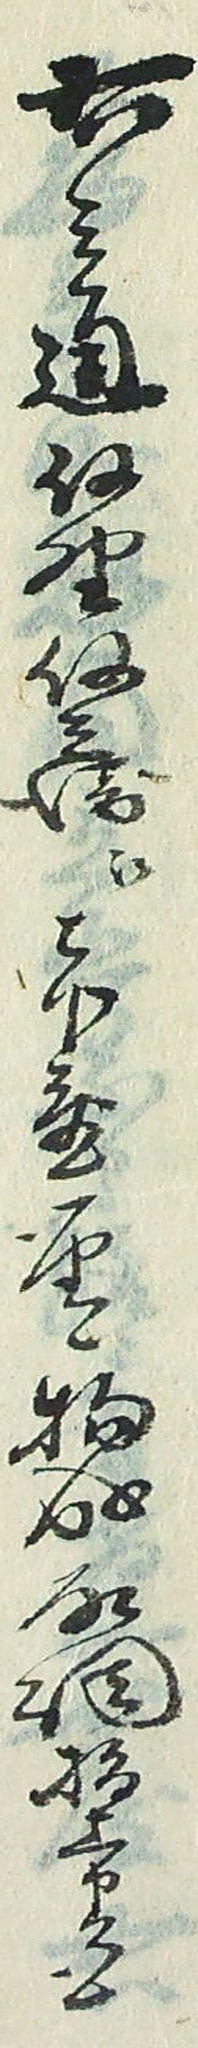右之通何野何兵衛江被下置御座候物成取調指上候以上
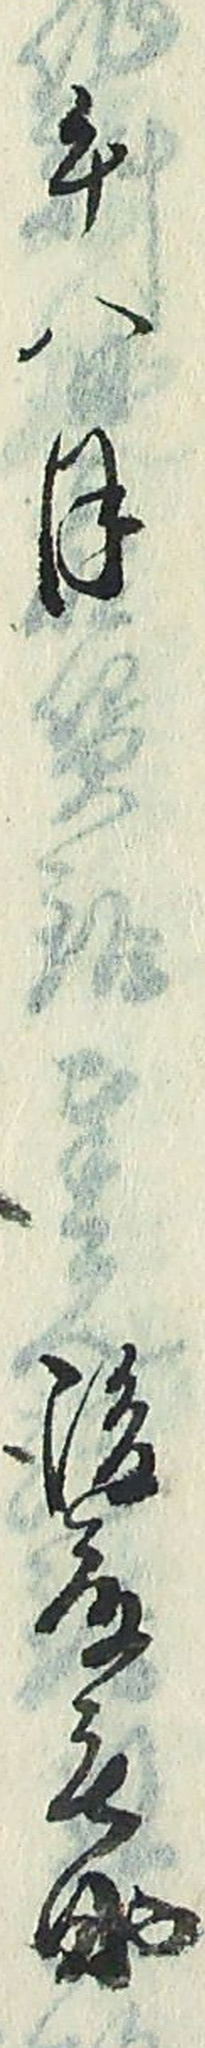午八月後藤庄助
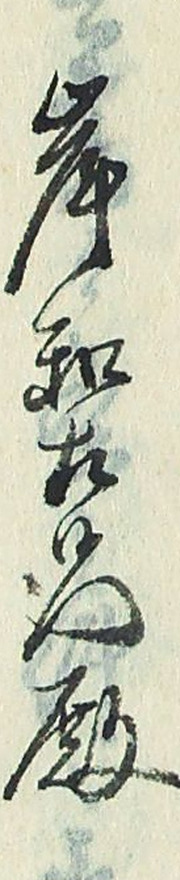岸和左衛門殿

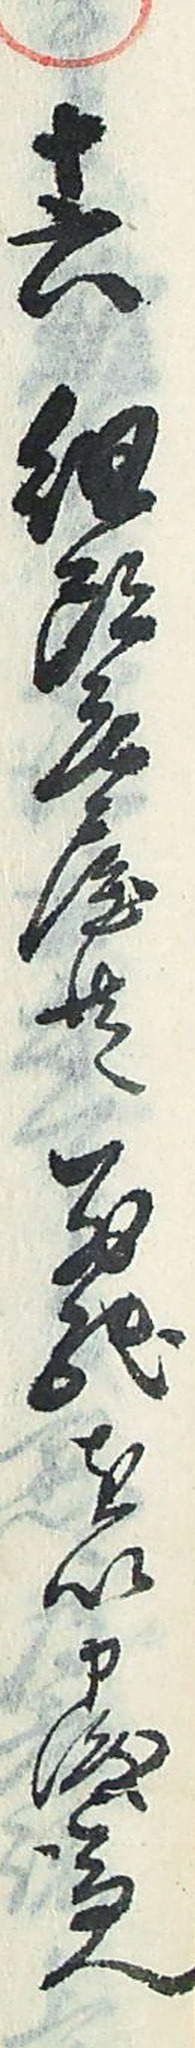○十六組頭庄屋共へ別紙を以申渡覚
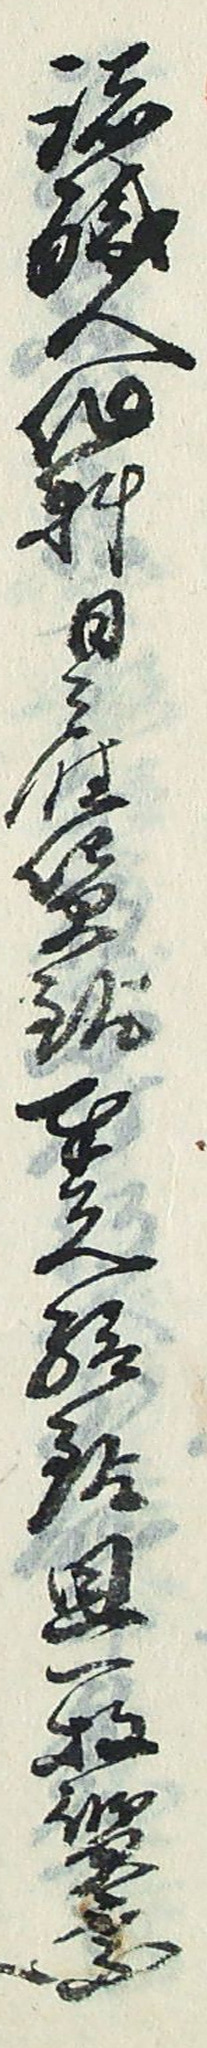諸職人作料日雇賃銀奉公人給銀且一牧質素
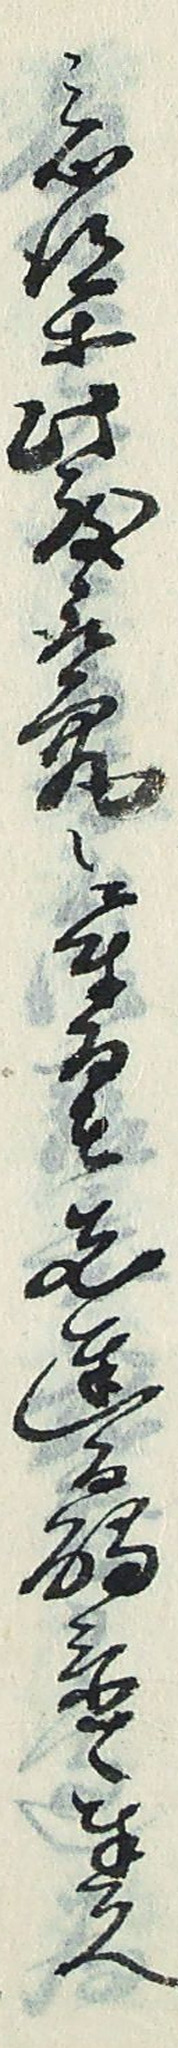之心得等此度取究候ニ付而者先達而觸置候奉公人
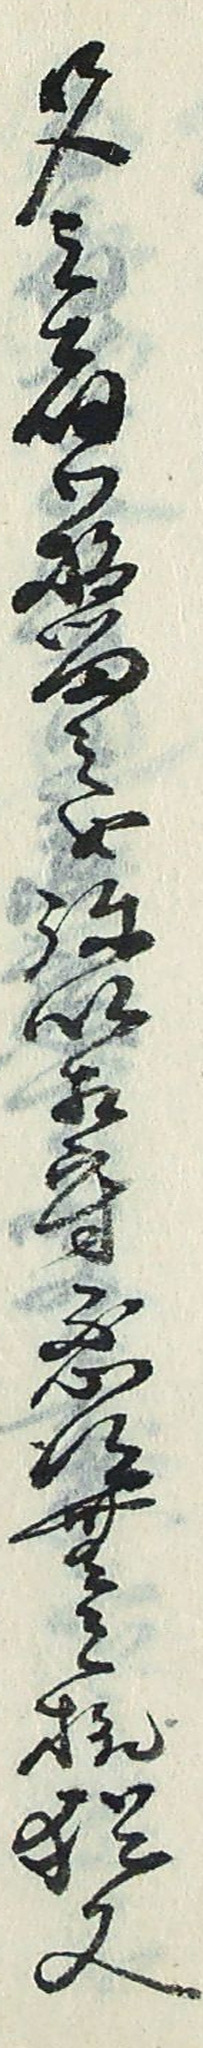口入之者御指留之義弥以相守不心得無之様猶又
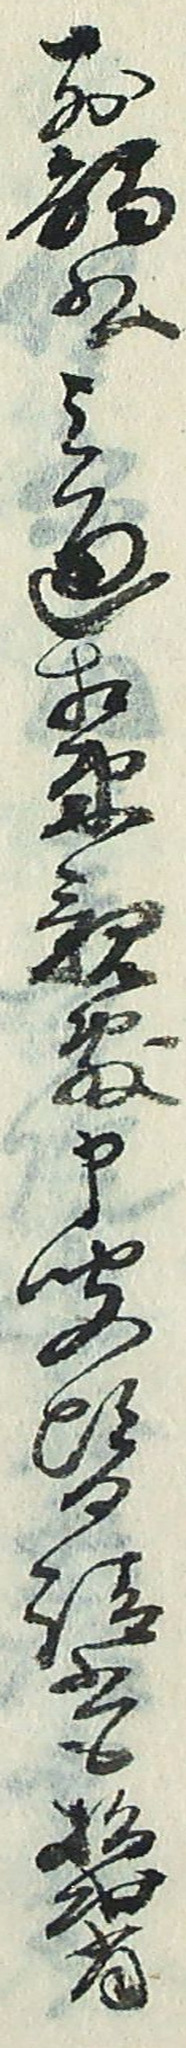前觸書之通相束親敷申聞頃日請書も指出有
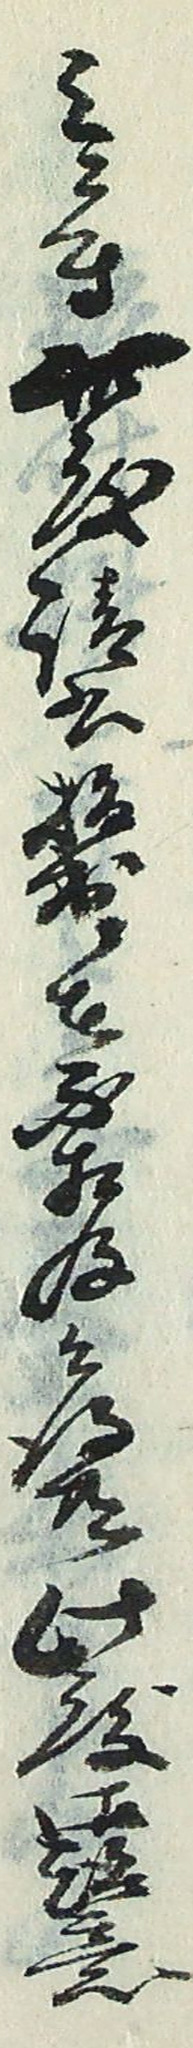之ニ付此度請書指出ニ者不相及候得共此度御趣意
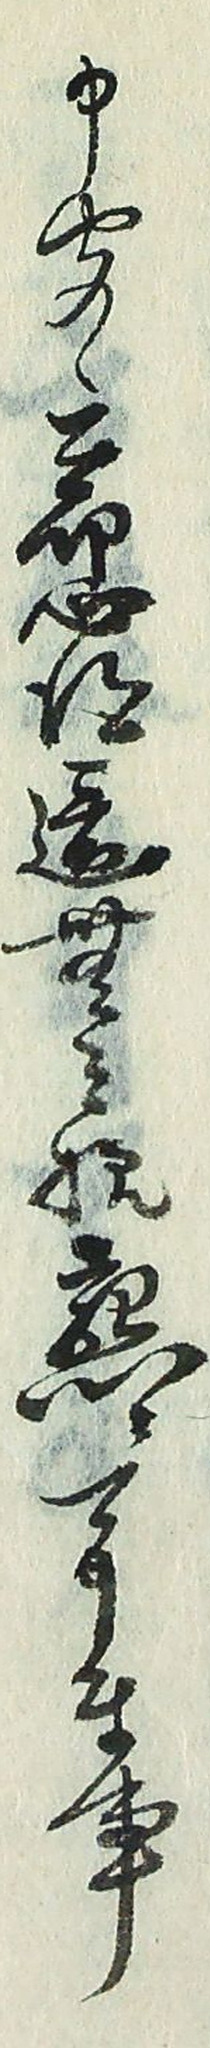申聞候節心得違無之様懇ニ可申付事
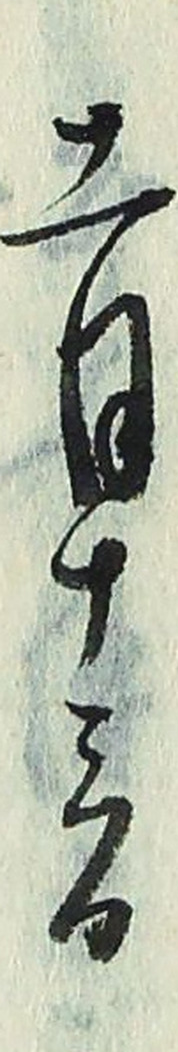十一月十三日
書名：諸御趣意書并御下知向之写
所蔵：鳴門教育大学 Naruto University of Education
